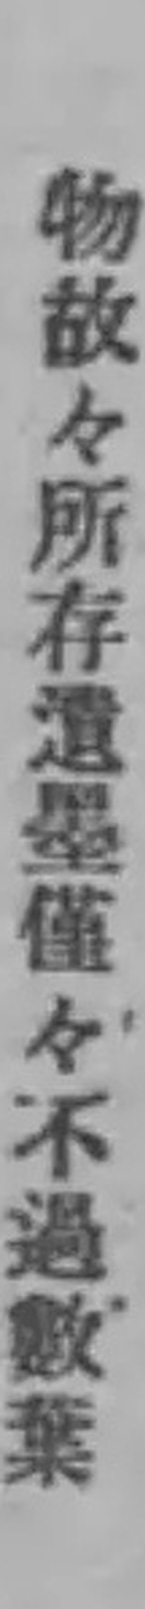物故々所存遺墨僅々不過数葉
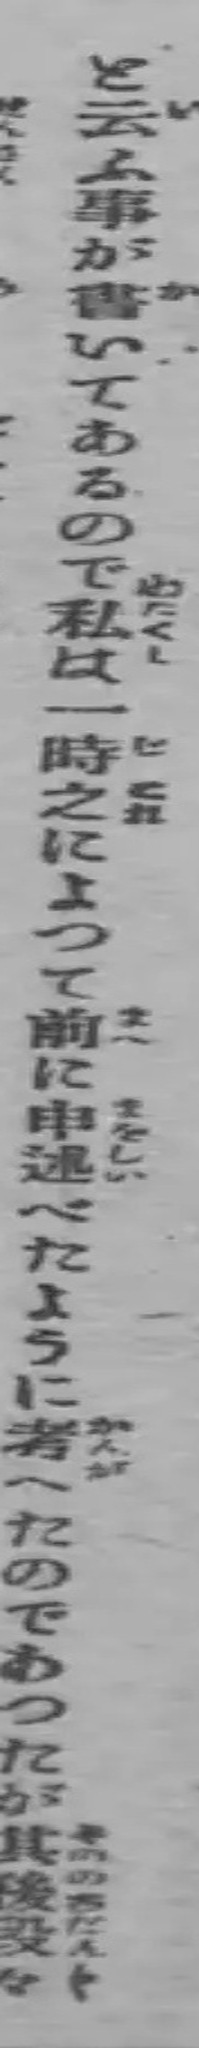と云ふ事が書いてあるので私は一時之によつて前に申述べたように考へたのであつたが其後段々
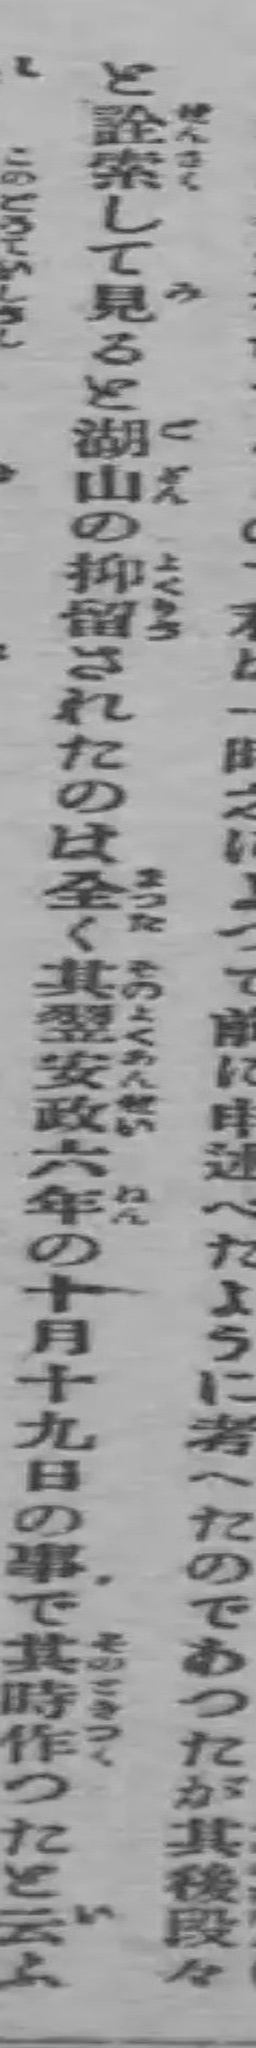と詮索して見ると湖山の抑留されたのは全く其翌安政六年の十月十九日の事で其時作つたと云ふ
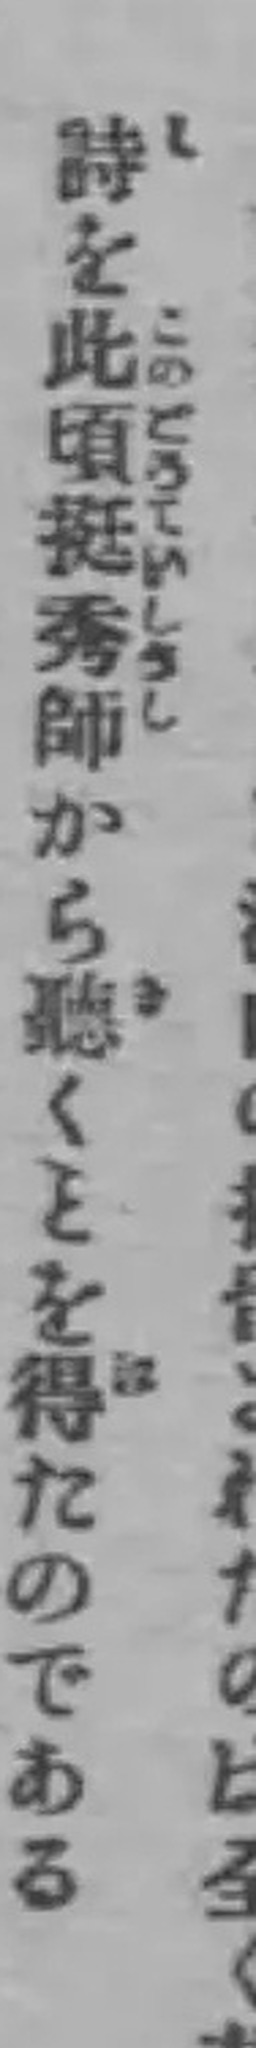詩を此頃挺秀師から聴くことを得たのである
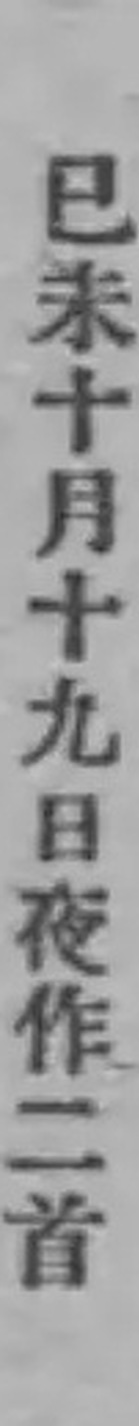巳未十月十九日夜作二首
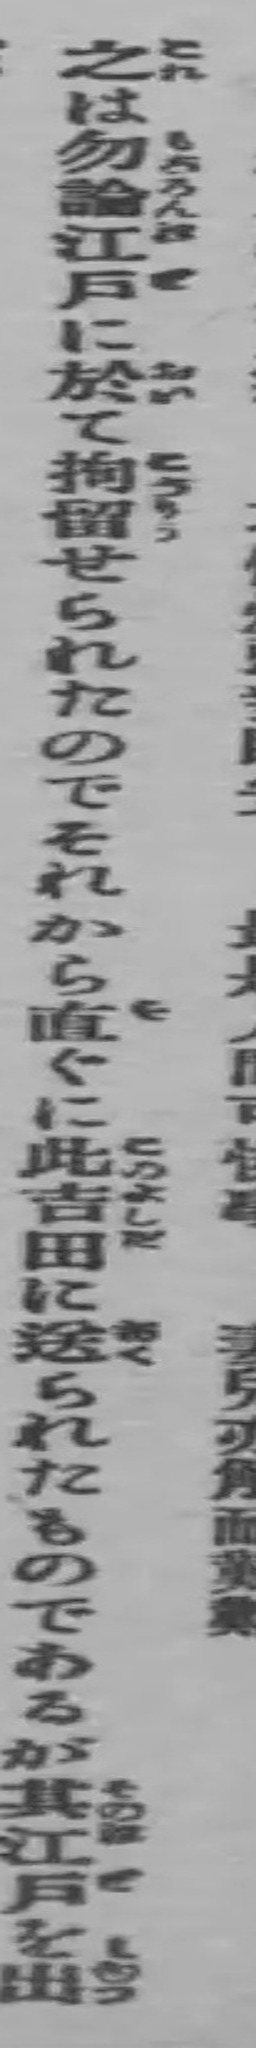之は勿論江戸に於て拘留せられたのでそれから直ぐに此吉田に送られたものであるが其江戸を出
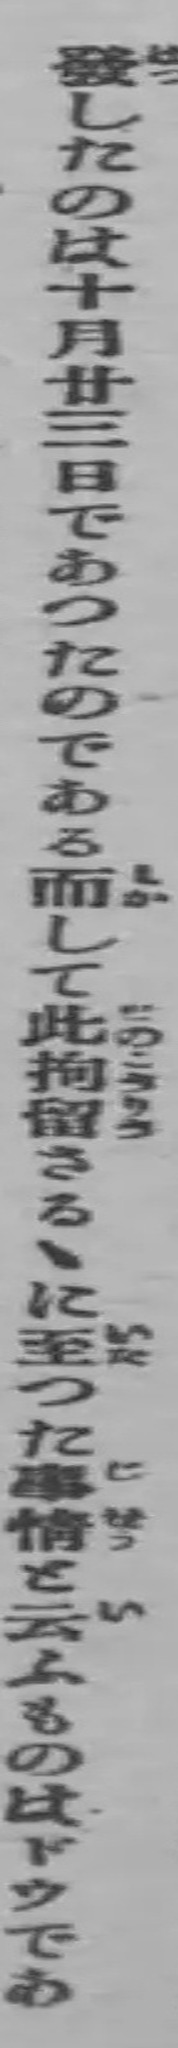発したのは十月廿三日であつたのである而して此拘留さるゝに至つた事情と云ふものはドウであ
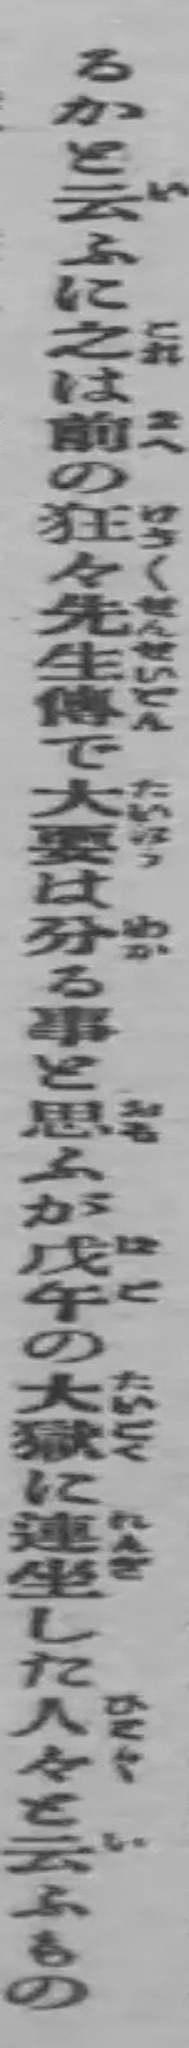るかと云ふに之は前の狂狂先生伝で大要は分る事と思ふが戊午の大獄に連坐した人々と云ふもの
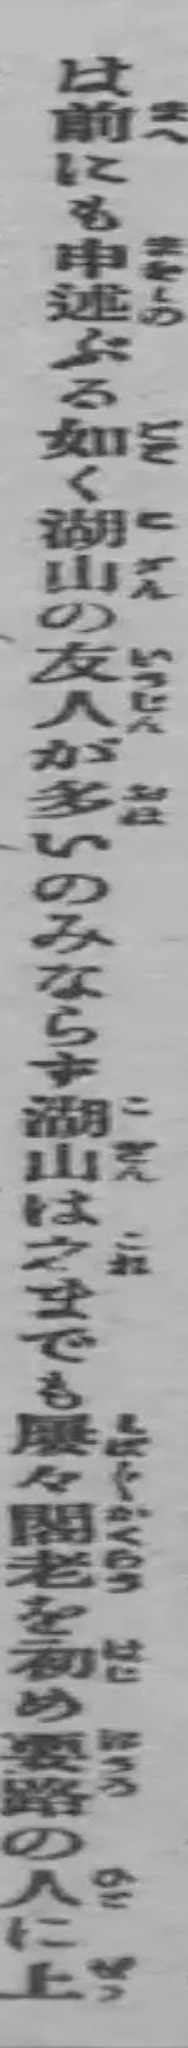は前にも申述ぶる如く湖山の友人が多いのみならず湖山は之までも屡々閣老を初め要路の人に上
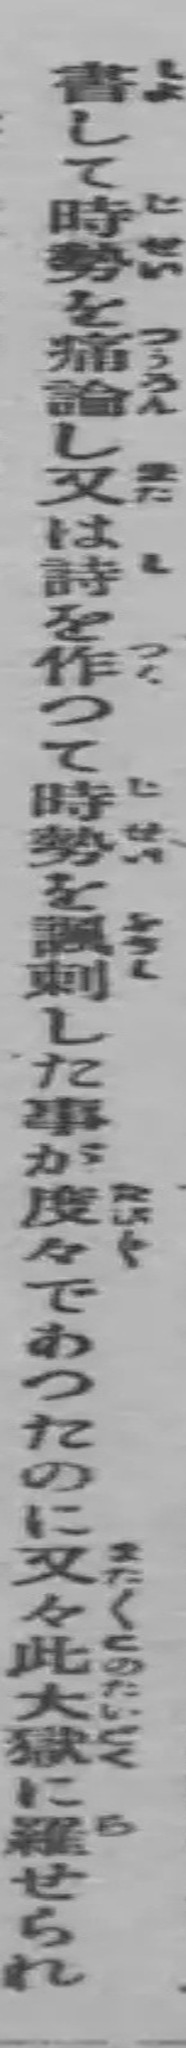書して時勢を痛論し又は詩を作つて時勢を諷刺した事が度々であつたのに又々此大獄に羅せられ
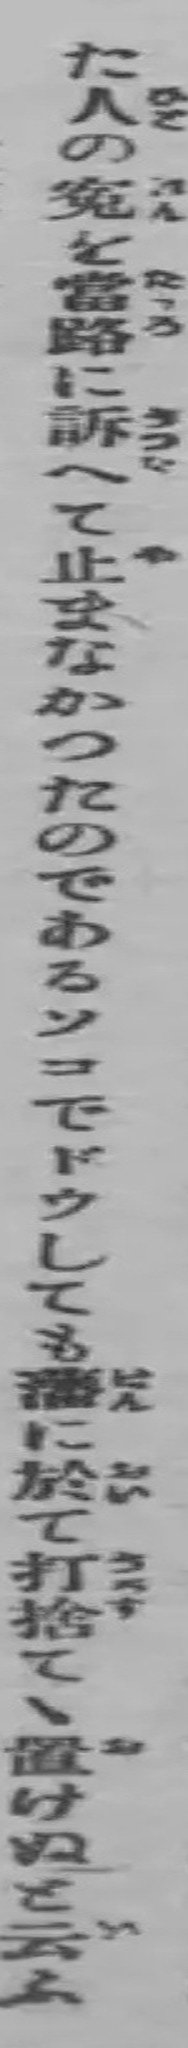た人の冤を当路に訴へて止まなかつたのであるソコでドウしても藩に於て打捨てゝ置けぬと云ふ
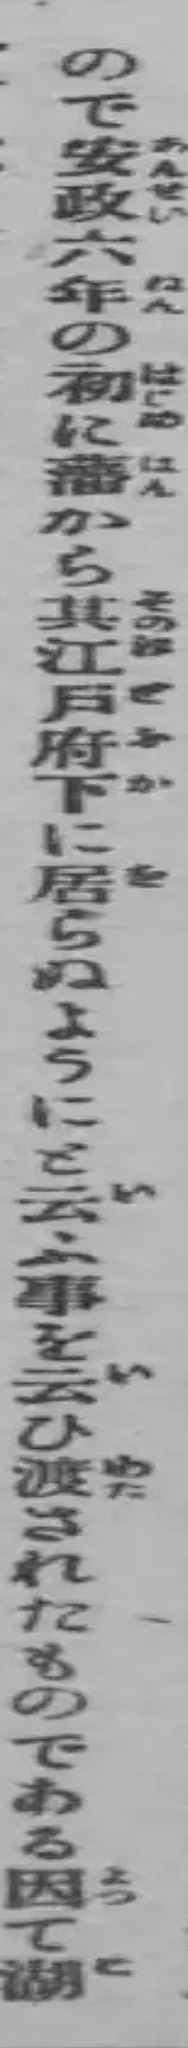ので安政六年の初に藩から其江戸府下に居らぬようにと云ふ事を云ひ渡されたものである因て湖
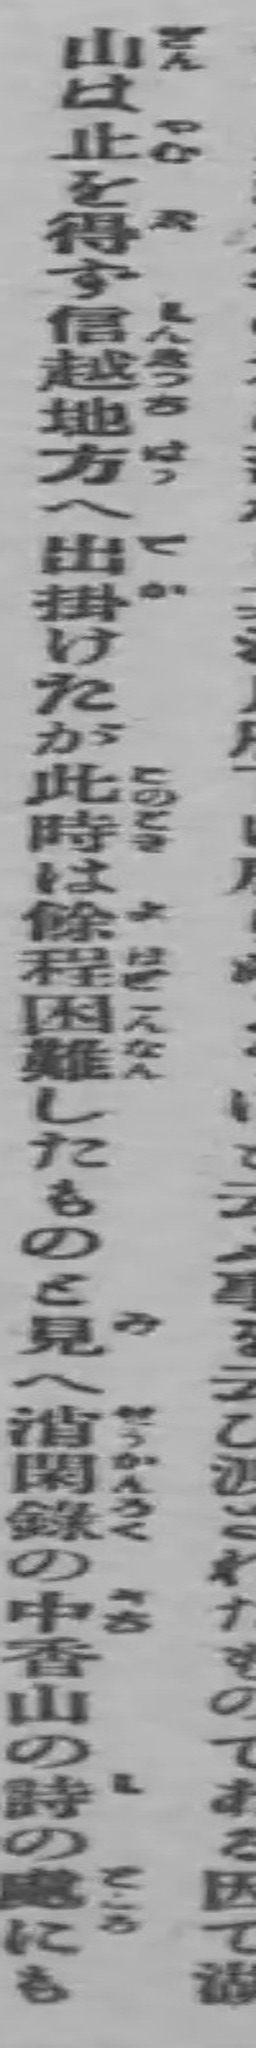山は止を得ず信越地方へ出掛けたが此時は余程困難したものと見へ消閑録の中香山の詩の処にも
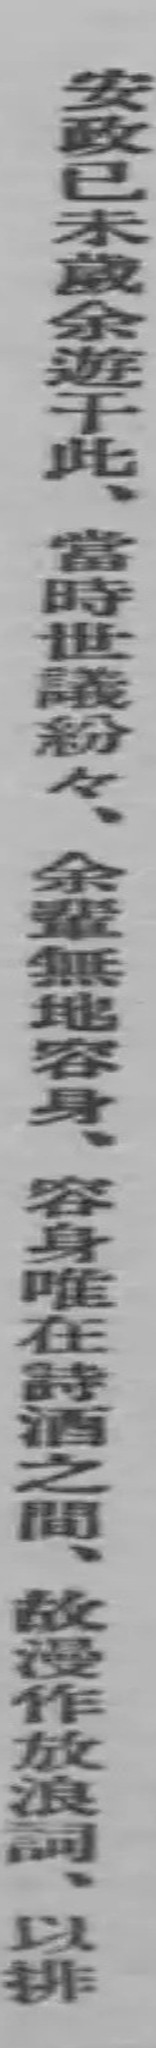安政巳未歳余遊于此、当時世議紛々、余輩無地容身、容身唯在詩酒之間、故漫作放浪詞、以排
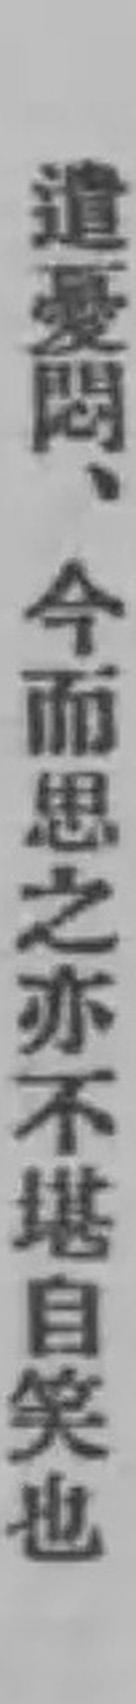遺憂悶、今而思之亦不堪自笑也
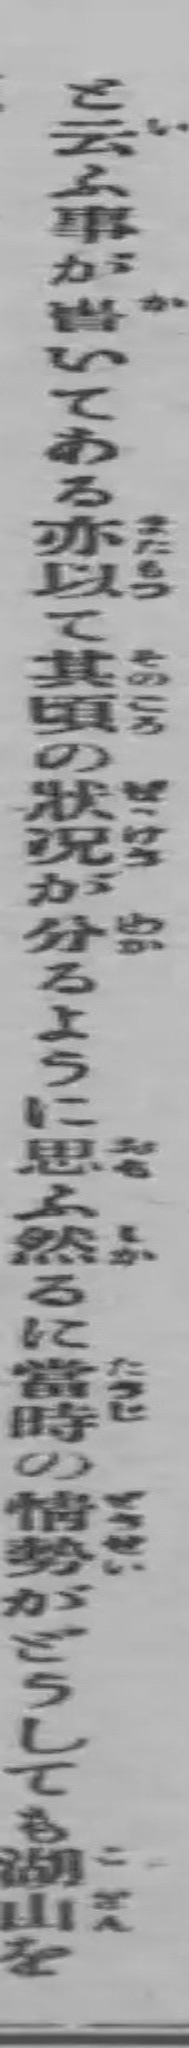と云ふ事が書いてある亦以て其頃の状況が分るように思ふ然るに当時の情勢がどうしても湖山を
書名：豊橋市史談
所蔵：国立国会図書館 National Diet Library, JAPAN
